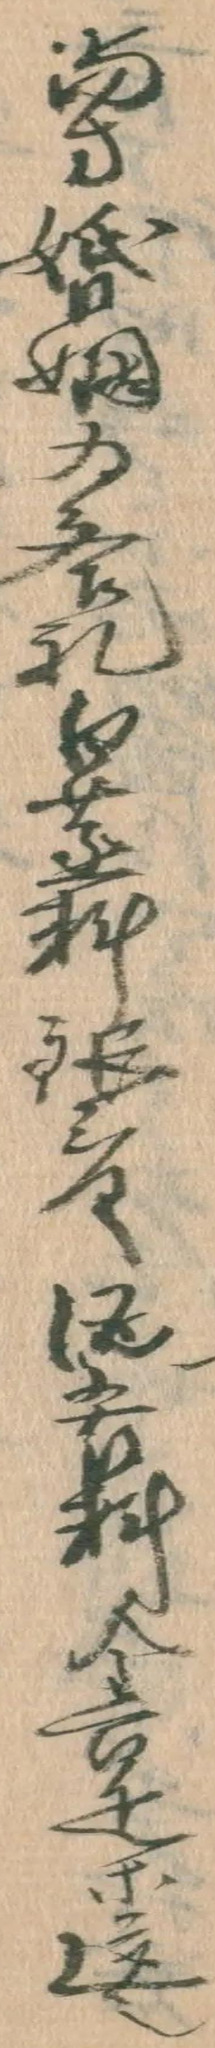當方婚姻為答礼白蒸料銀三匁酒肴料金百疋等送也
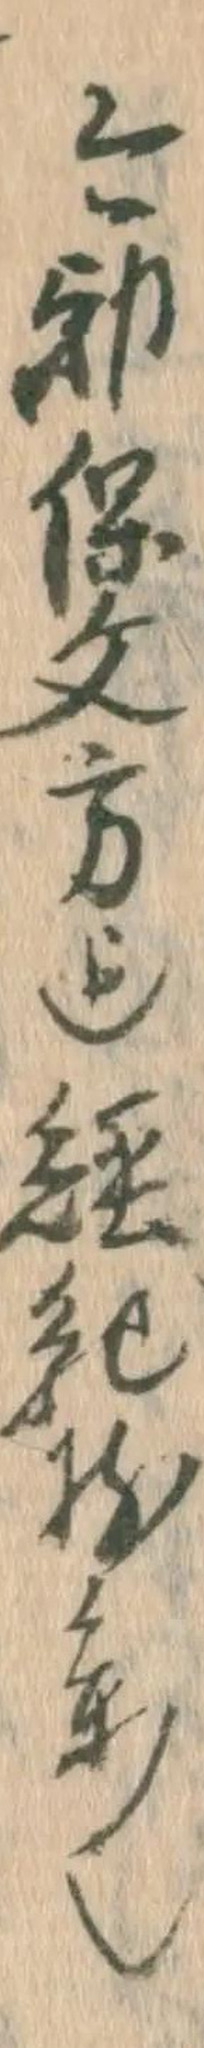今朝保文方迄経紀持参也
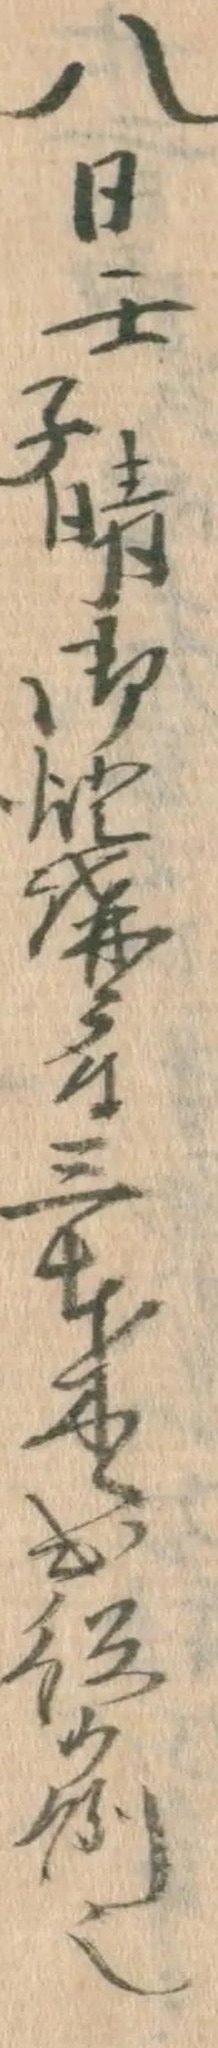八日壬子晴御燈講ニ付三本木へ出役如例也
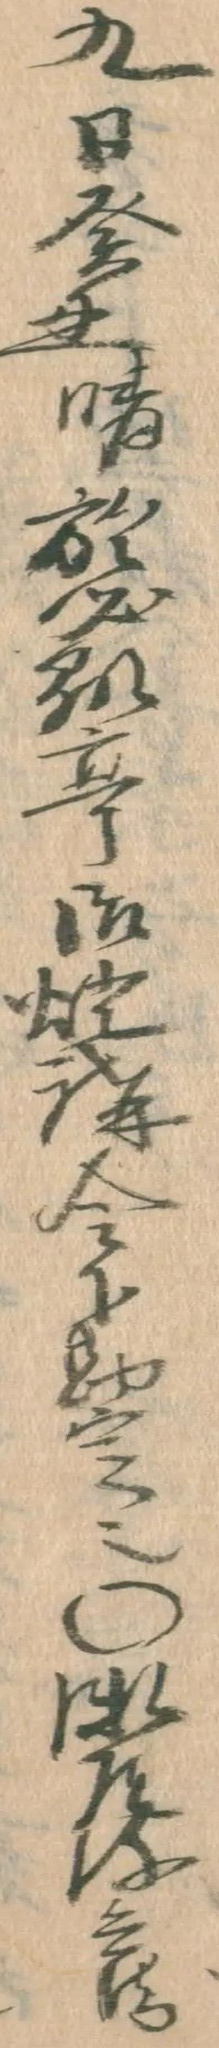九日癸丑晴於必顕亭御燈講令下勘定也○瀬尾弥兵衛
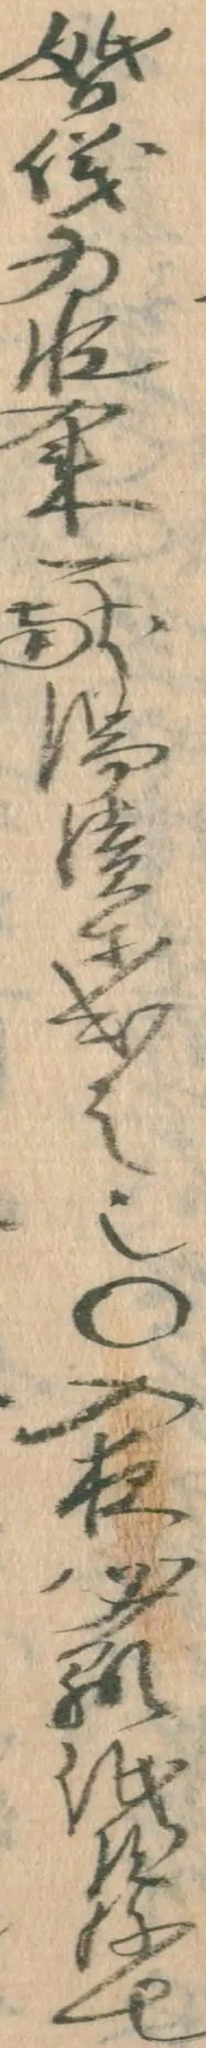婚儀為祝入来一献湯漬等出之也○入夜必顕紙屋弥七
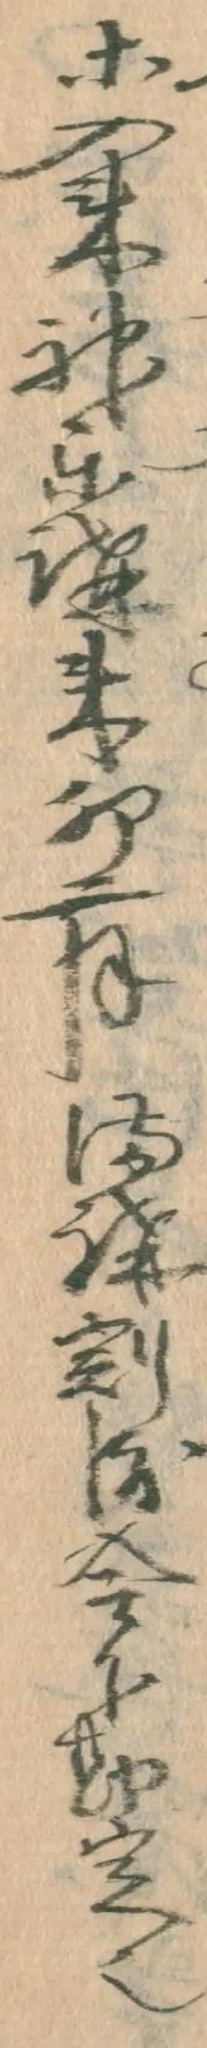等入来神楽講来卯二月満講割渡令下勘定也

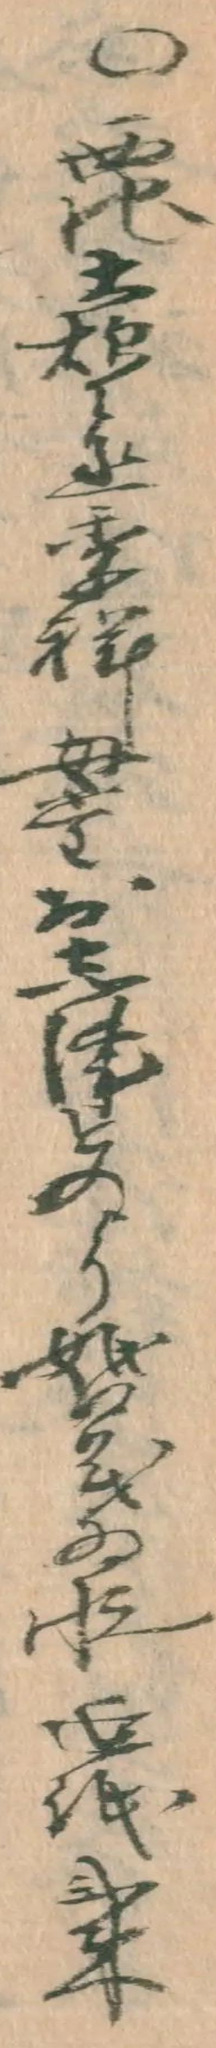〇西地大炊丞季祥母堂おしつとのより婚義為祝紙弐朱
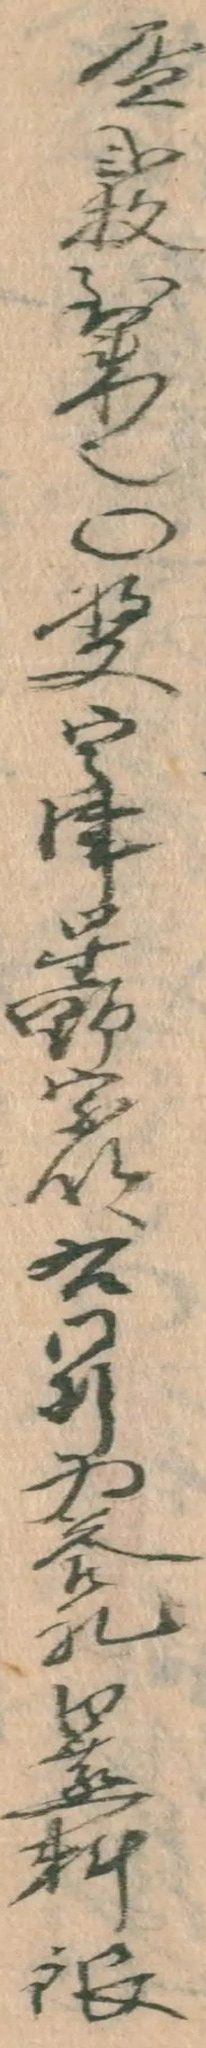盃弐枚到来也○将又宇津星野宗以へ右同断為答礼白蒸料銀
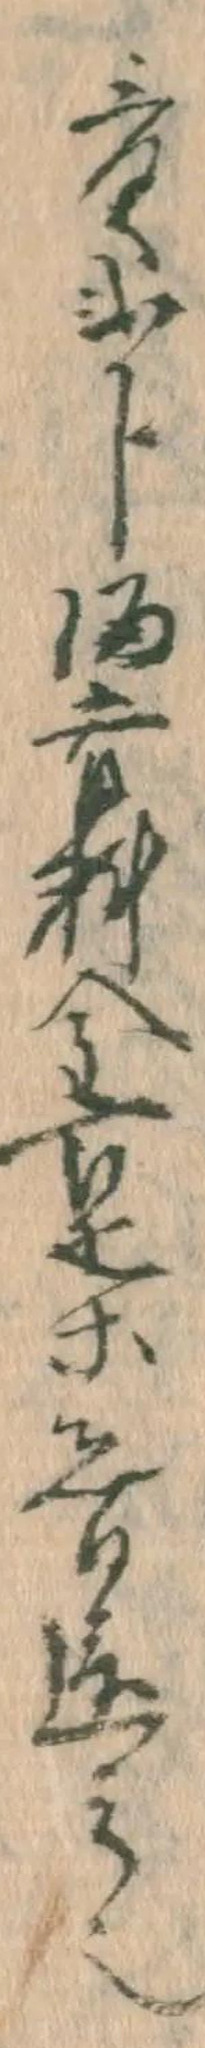三匁弐分酒肴料金百疋等先日送之也
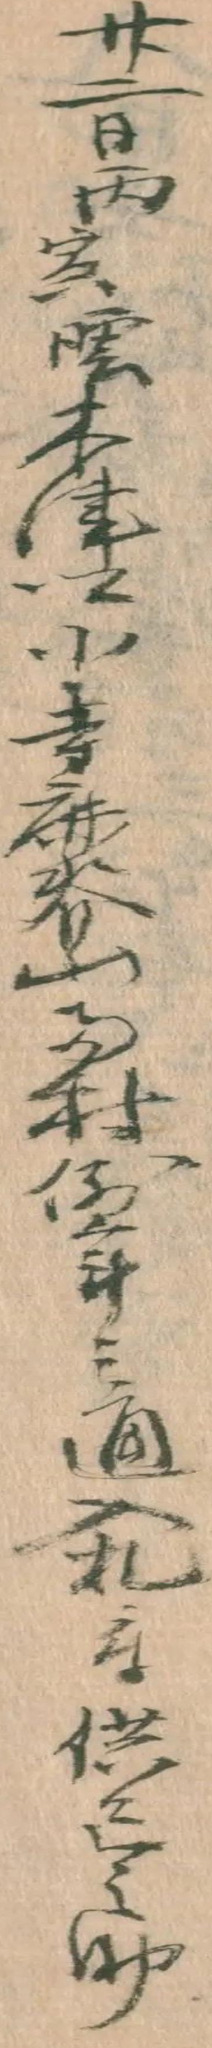廿二日丙寅曇木津郷小寺鹿背山當村ヘ例斗之通入札ニ付供己之助
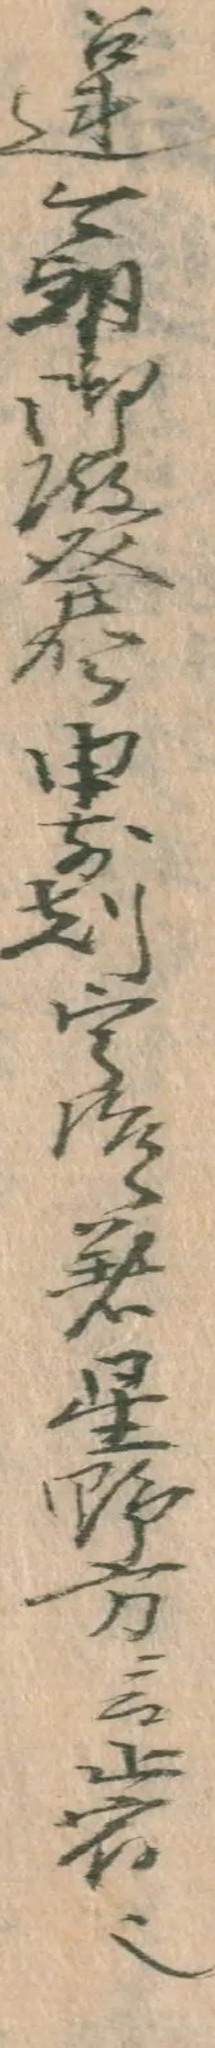召連今朝御殿発駕申前刻宇治へ着星野方ニ而止宿也
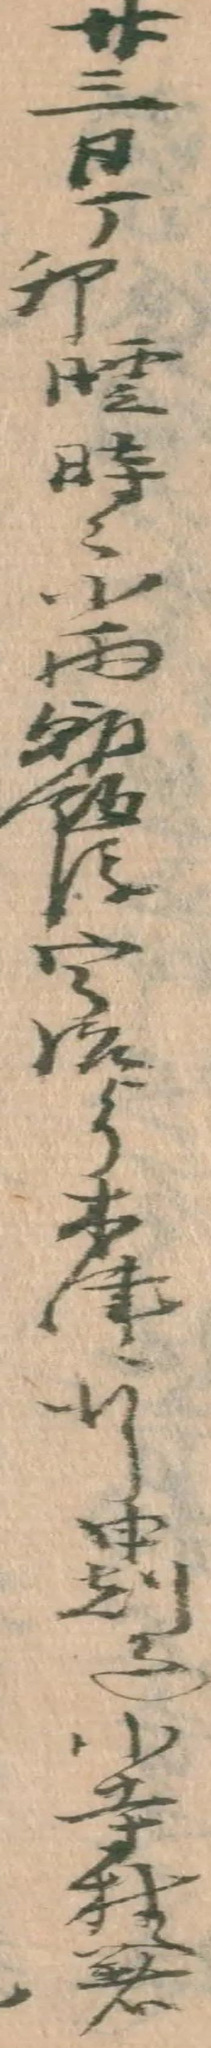廿三日丁卯曇時々小雨朝風後宇治より木津ヘ行申刻過小寺村へ著
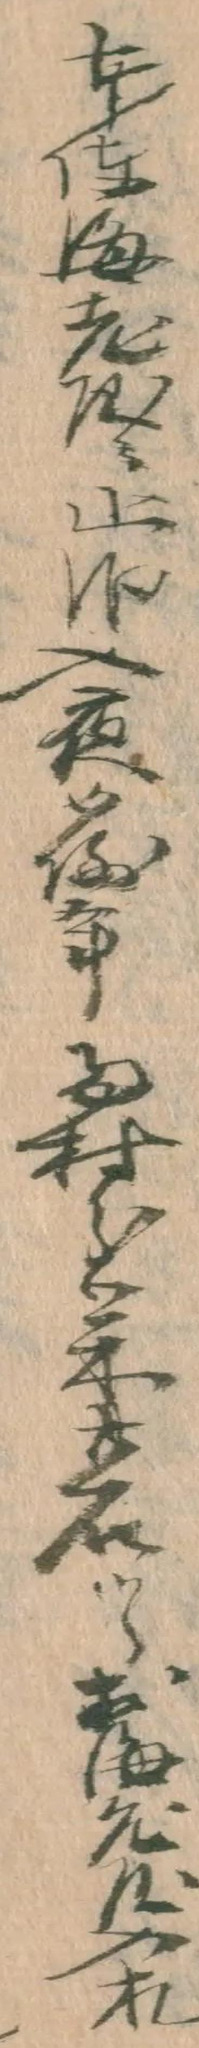本陣海老屋え止泊入夜如例年當村分は米廿石ツヽ出海老屋入札
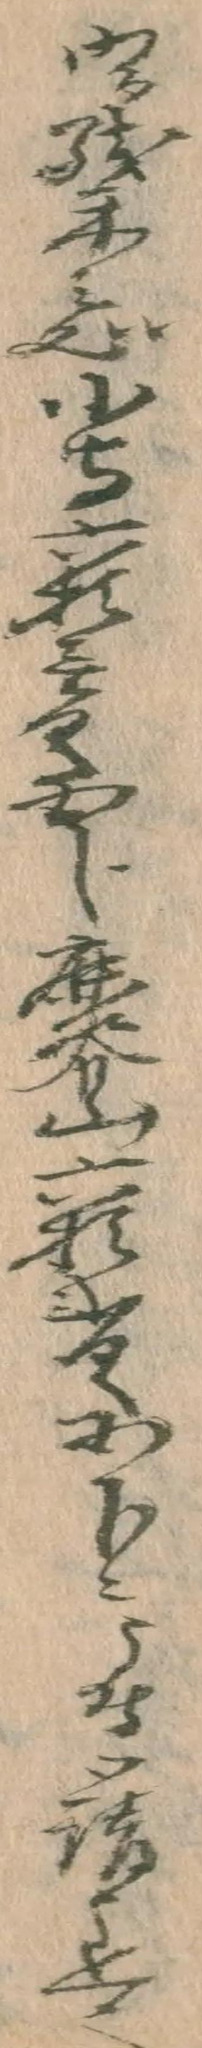仍而残米之処小寺六拾壱匁五分鹿背山六拾弐匁五歩に申付御請申上也
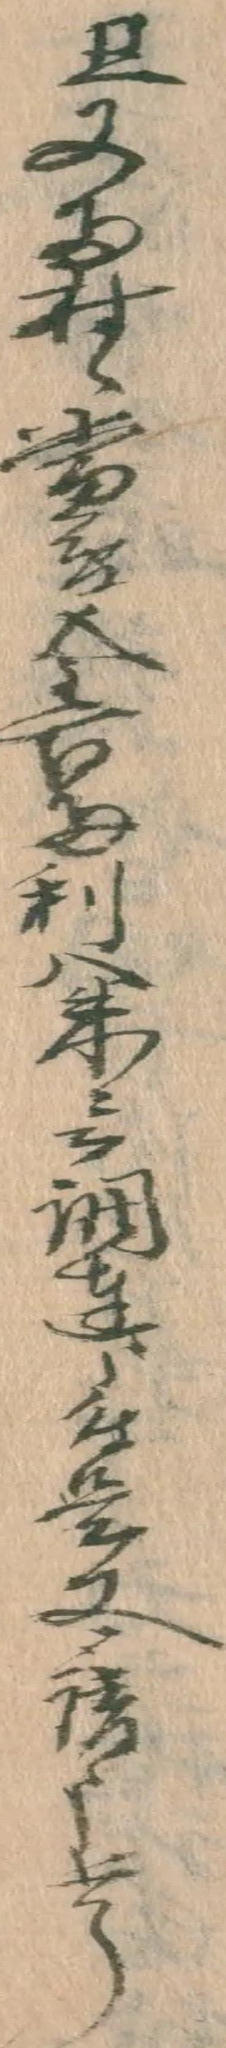且又両村へ當春金百両利八朱ニ而調達申付是又御請申上了
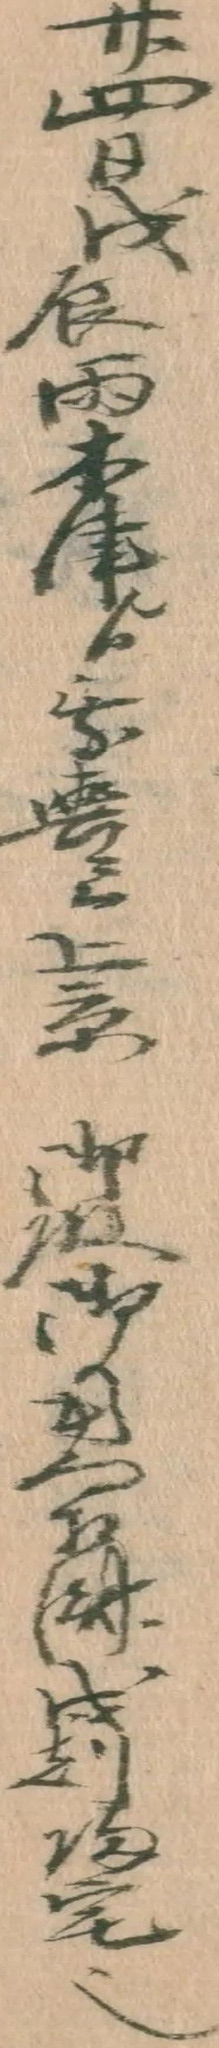廿四日戊辰雨木津ゟ乗輿二而上京御殿御用向相済戌刻帰宅也
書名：賀茂社記録. 第69冊
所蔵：国立国会図書館 National Diet Library, JAPAN
